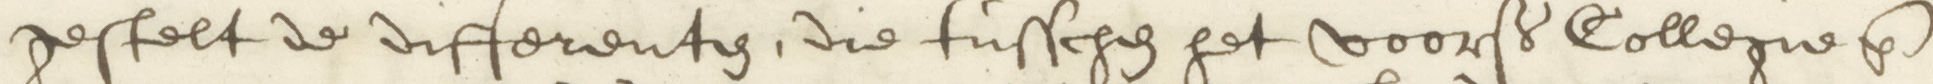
gestelt de differenten, die tusschen het voorss. Collegie &
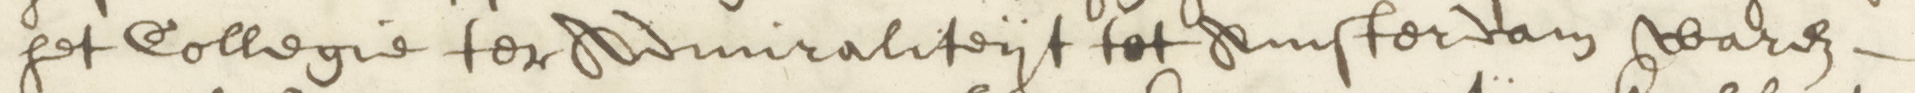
het Collegie ter Admiraliteijt tot Amsterdam waren -
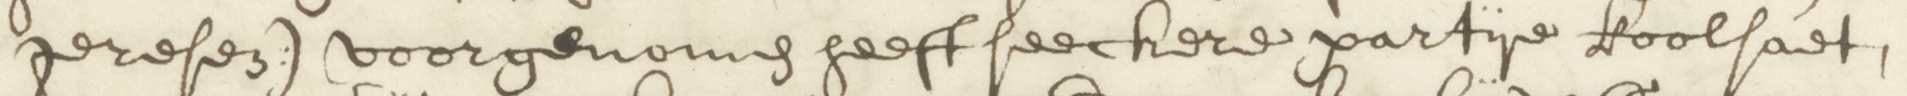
geresen:) voorgenomen heeft seeckere partije Koolsaet,
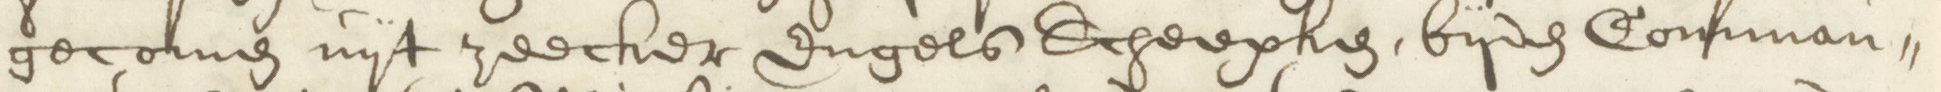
gecomen uijt zeecker Engels Scheepken, bijden Comman„
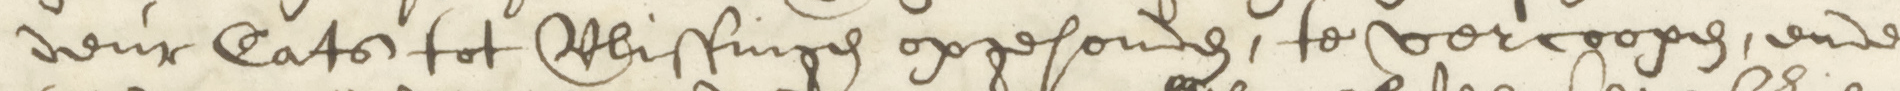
deur Cats tot Vlissingen opgesonden, te vercoopen, ende
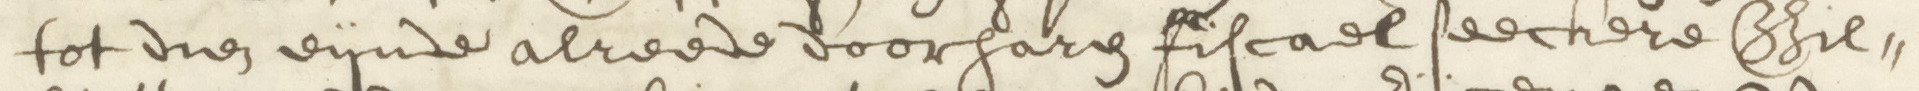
tot dien eijnde alreede door haren fiscael seeckere Bil„
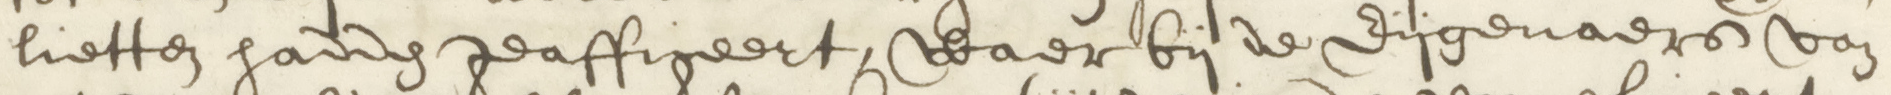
lietten hadden geaffigeert, waer bij de Eijgenaers van
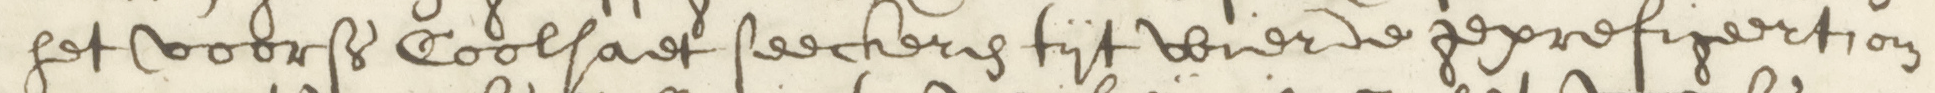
het voorss. Coolsaet seeckeren tijt wierde geprefigeert, om
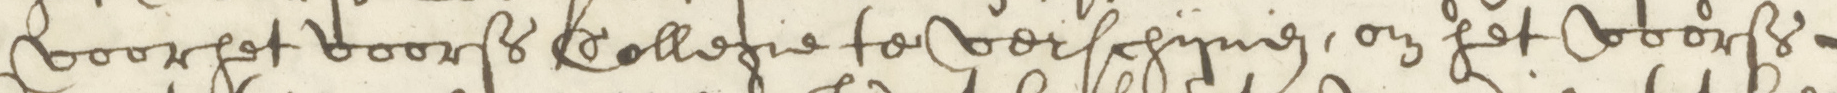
voor het voorss. Collegie te verschijnen, om het voorss.—
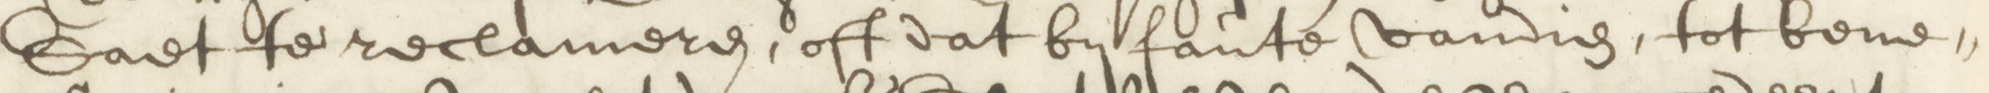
Saet te reclameren, oft dat bij faute vandien, tot bene„
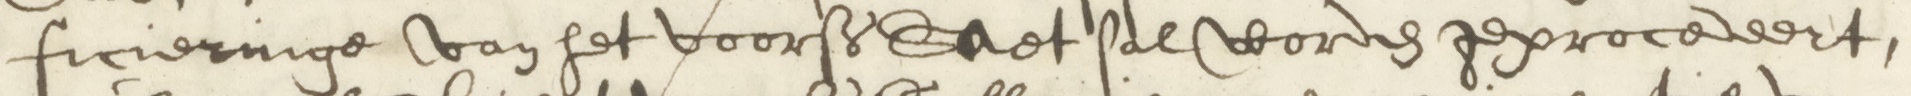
ficieringe van het voorss. Saet sal worden geprocedeert,
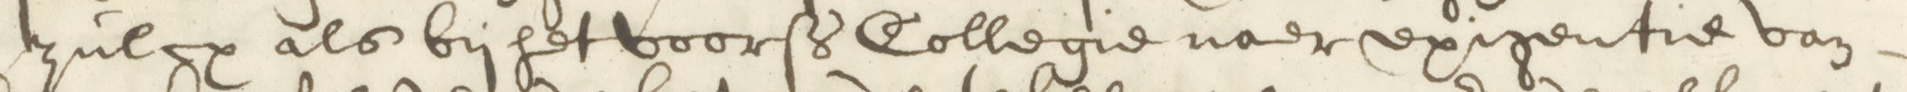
zulcx als bij het voorss. Collegie naer exigentie van
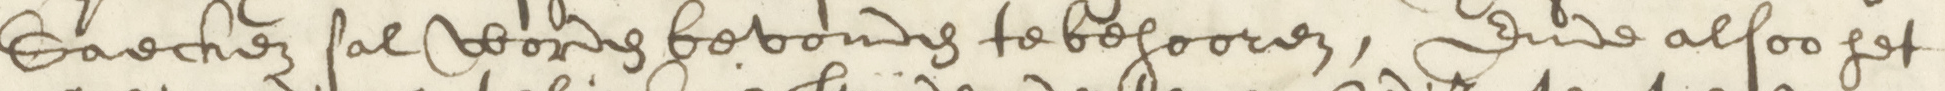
Saecken sal worden bevonden te behooren, Ende alsoo het
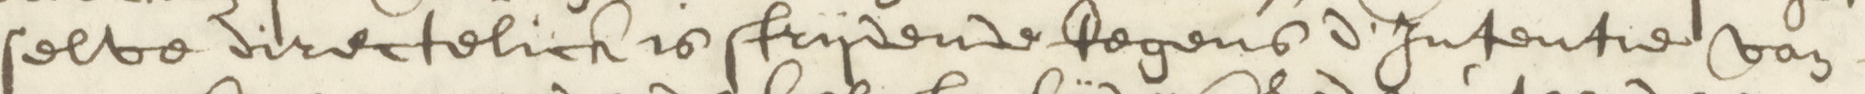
selve directelick is strijdende tegens d‛ Intentie van
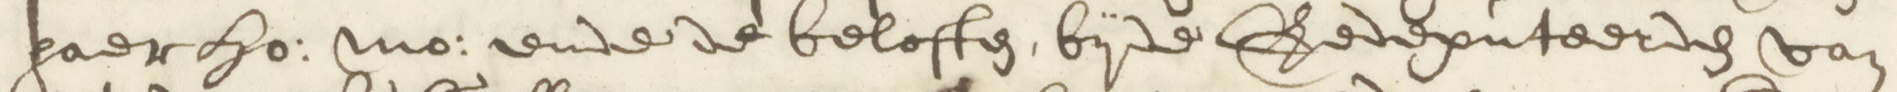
haer Ho:Mo: ende de beloften, bijde Gedeputeerden van
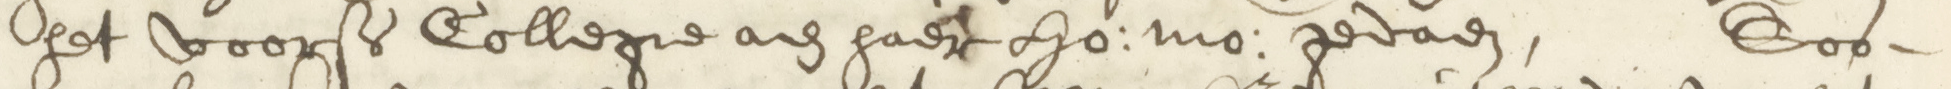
het voorss. Collegie aen haer Ho:Mo: gedaen, Soo
